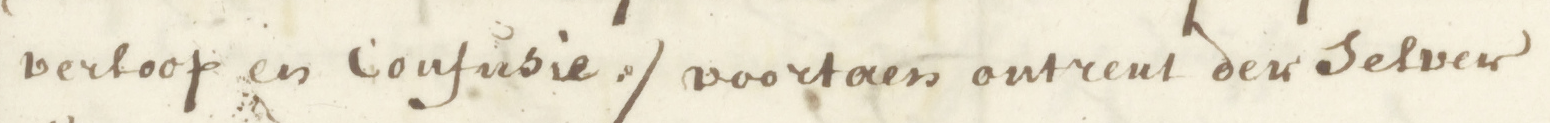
verloop en confusie:) voortaen ontrent der selver
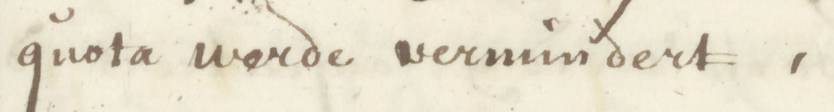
quota worde vermindert,
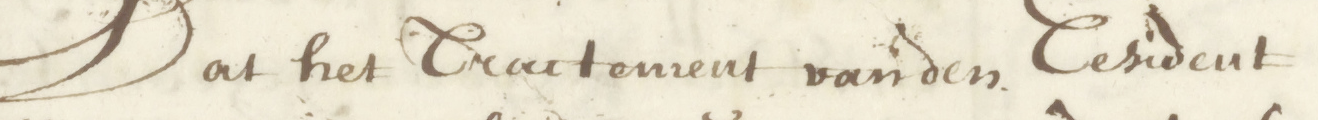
Dat het Tractement vanden Resident
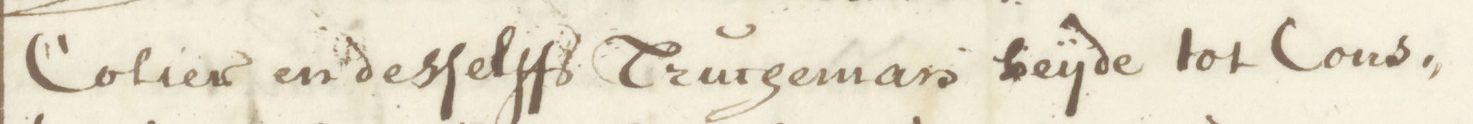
Colier en desselffs Trucheman beijde tot Cons„
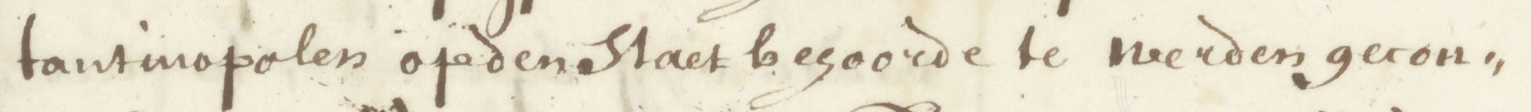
tantinopolen opden Staet behoorde te werden gecon„
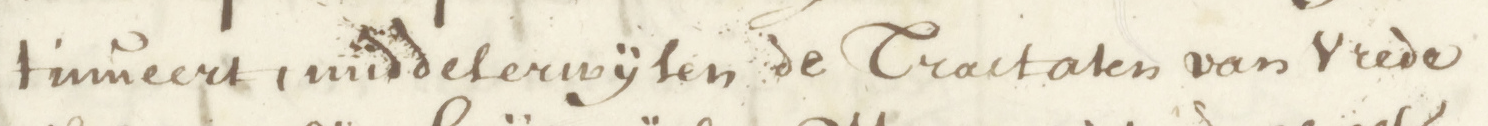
tinueert, middelerwijlen de Tractaten van Vrede
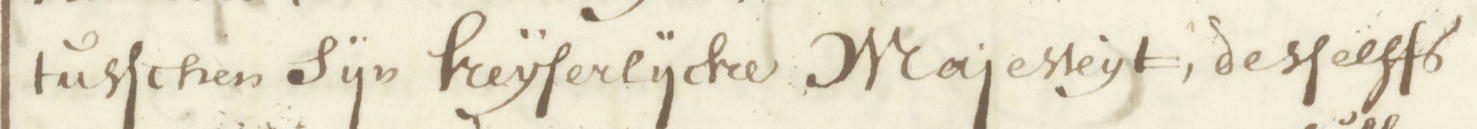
tusschen sijn Keijserlijcke Majesteijt, desselffs
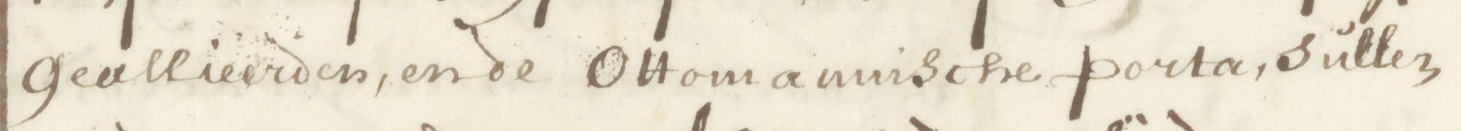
geallieerden, ende Ottomannische porta, sullen
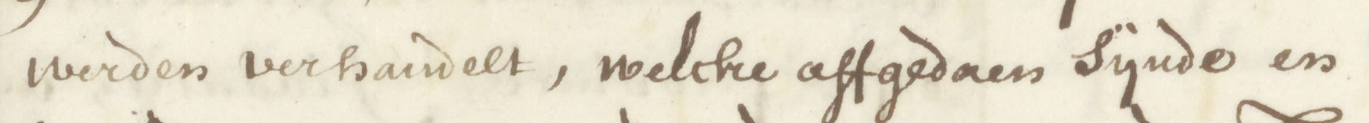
werden verhandelt, welcke affgedaen sijnde en
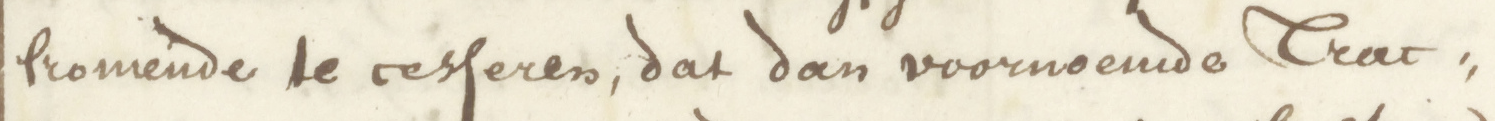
komende te cesseren, dat dan voornoemde Trac„
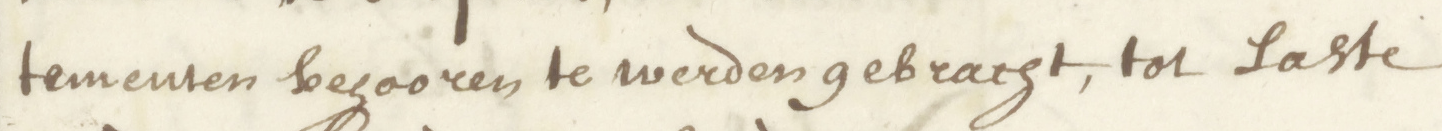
tementen behooren te werden gebracht, tot Laste
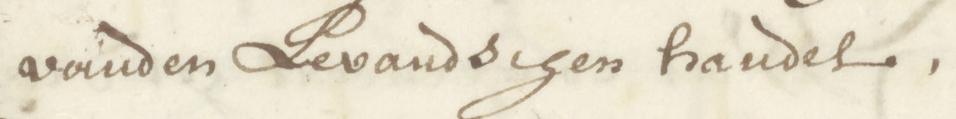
vanden Levandschen handel,
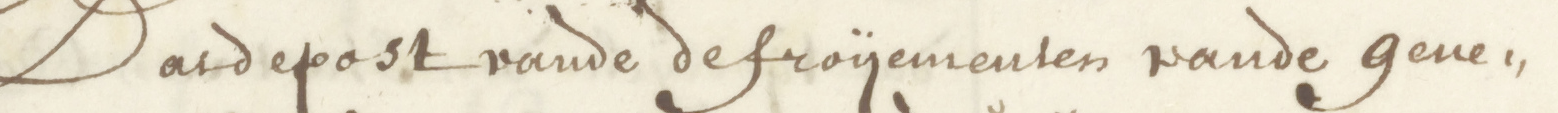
Dat de post vande defroijementen vande gene„
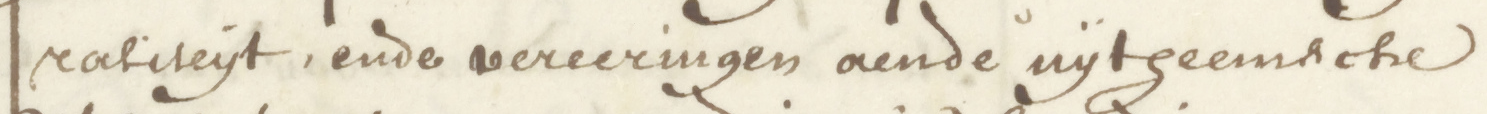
raliteijt, ende vereeringen aende uijtheemsche
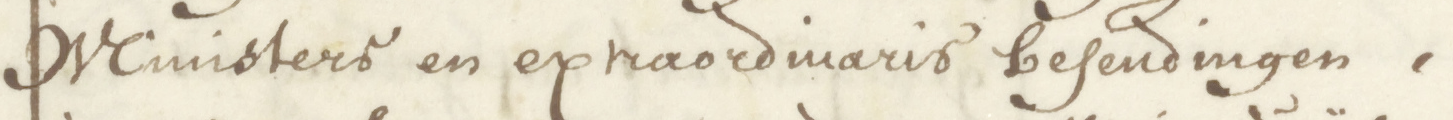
Ministers en extaordinaris besendingen.
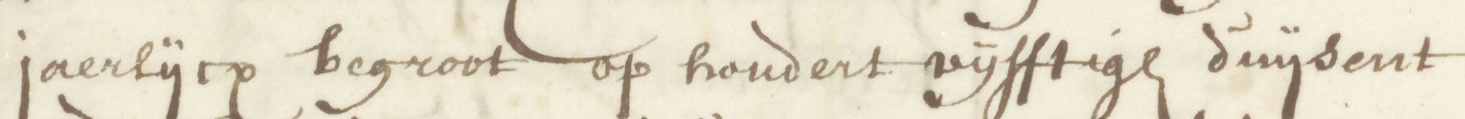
jaerlijcx begroot op hondert vijfftigh duijsent
